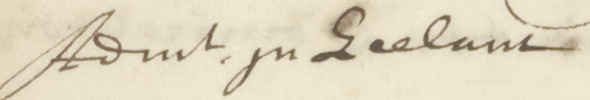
Admt. in Zeelant
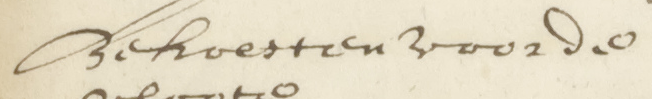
Behoeften voor de
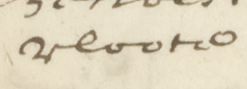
vloote
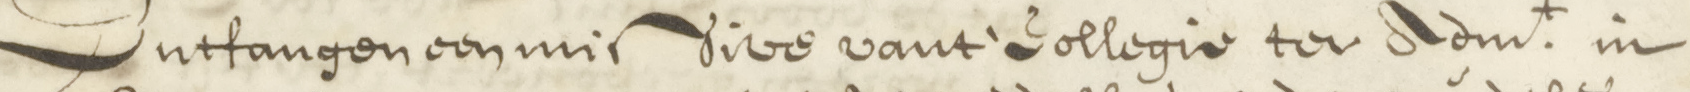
Ontfangen een missive vant' Collegie ter Admt. in
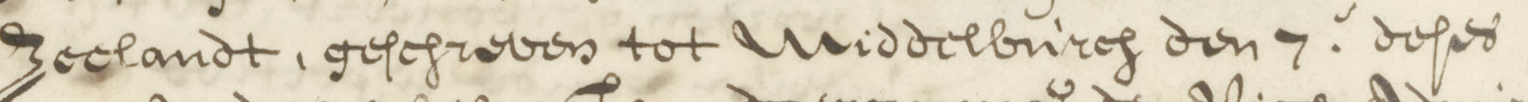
Zeelandt, geschreven tot Middelburch den 7e. deses,
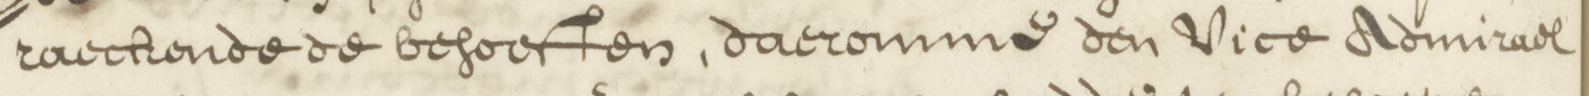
raeckende de behoeften, daeromme den Vice Admirael
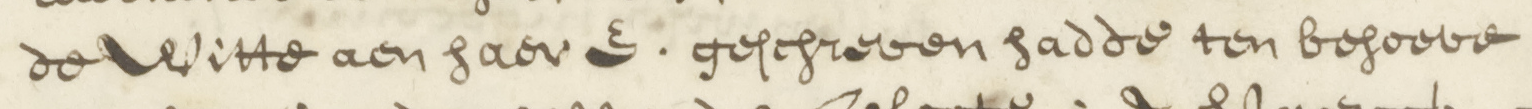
de Witte aen haer E. geschreven hadde ten behoeve
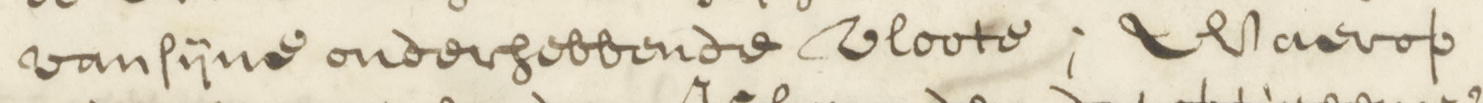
van sijne onderhebbende vloote. Waerop
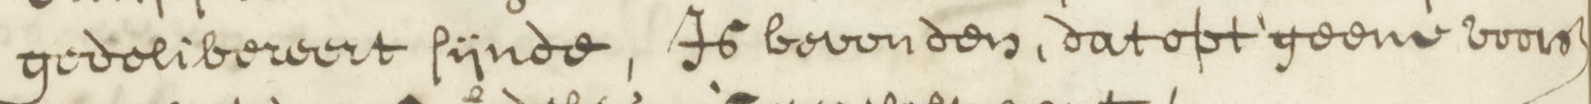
gedelibereert sijnde, Is bevonden, dat opt' geene voorsz
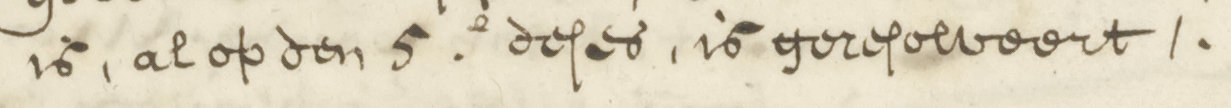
is, al op den 5e. deses, is geresolveert.
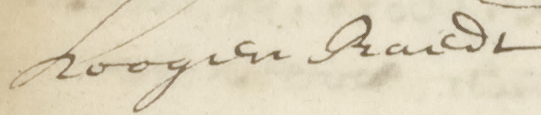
Hoogen Raedt
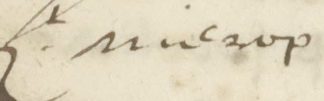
Lt. nierop
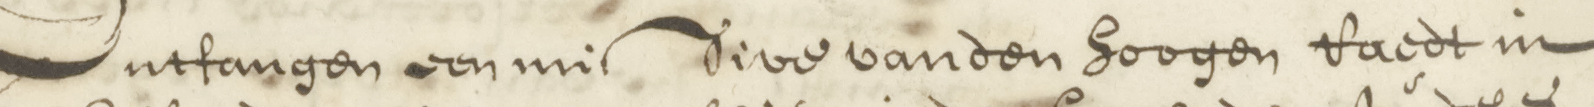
Ontfangen een missive van den Hoogen Raedt in
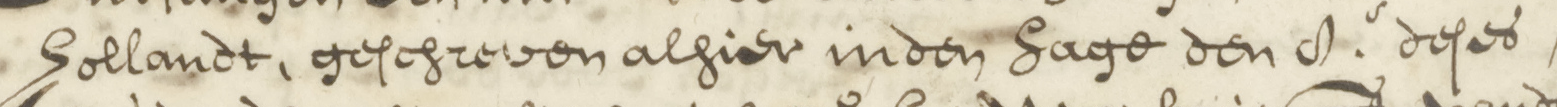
Hollandt, geschreven alhier in den Hage den 8e. deses,
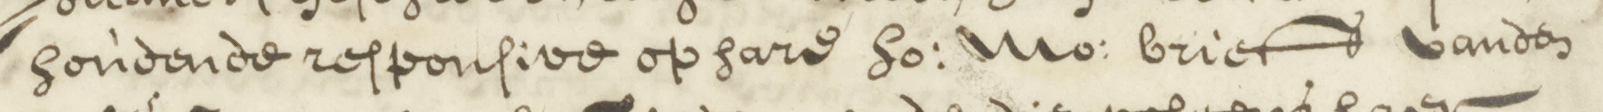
houdende responsive op hare Ho:Mo: brieff vanden
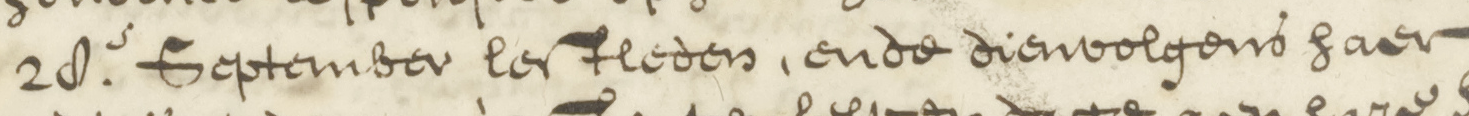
28e. September lestleden, ende dienvolgens haer
